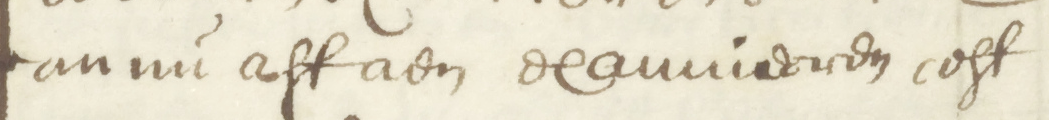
van nu aff aen examineren, off
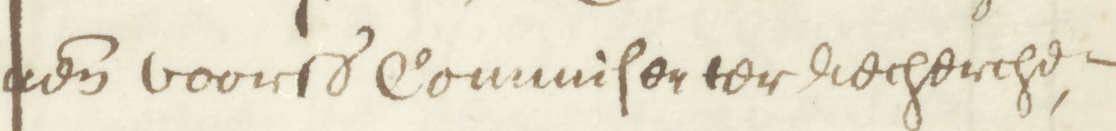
aen voors Commisen ter recherche,
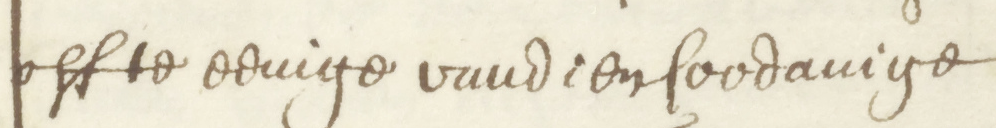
offte eenige vandien soodanige
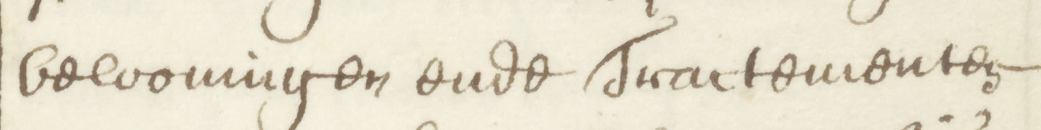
belooningen ende Tracementen
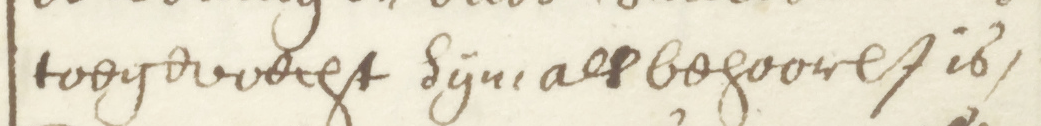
toegevoecht sijn, als behoorl is,
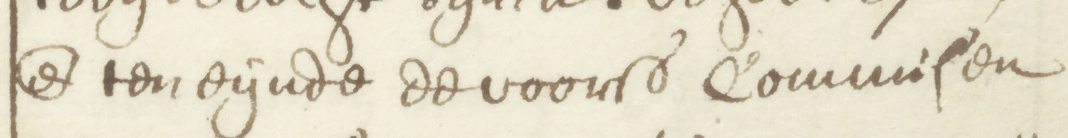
& ten eijnde de voors Commisen
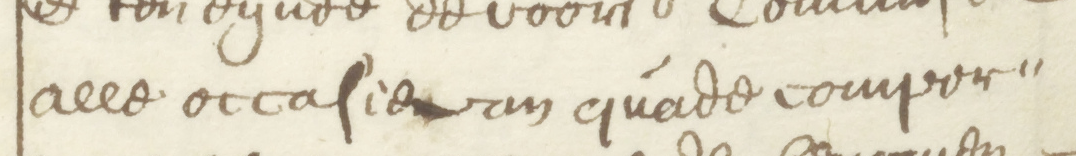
alle occasie van quade compor„
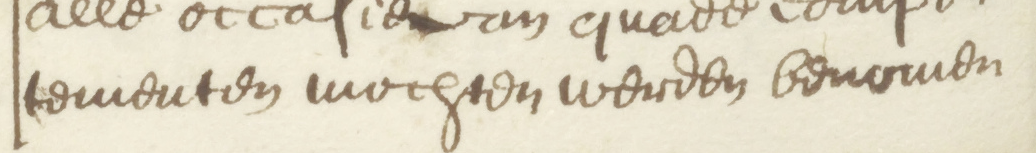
„tementen mochten werden benomen —
